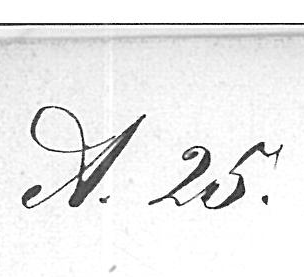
A. 25.
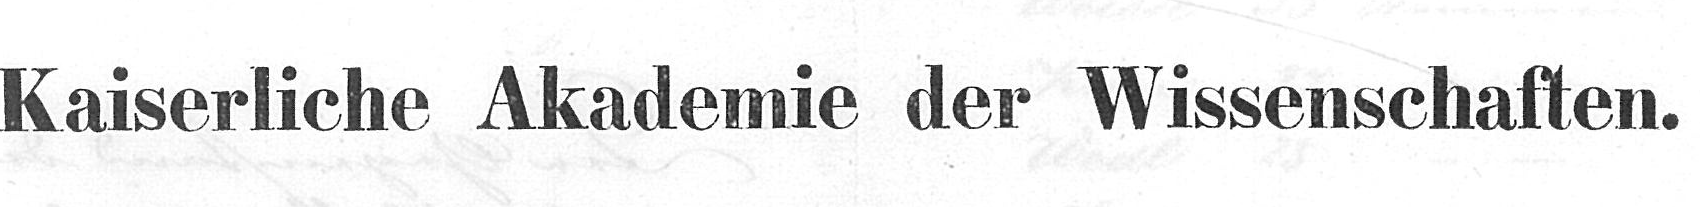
Kaiserliche Akademie der Wissenschaften.
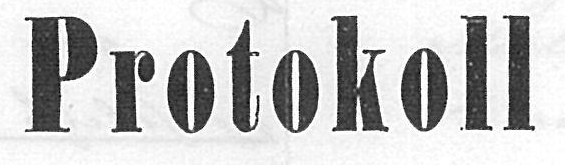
Protokoll
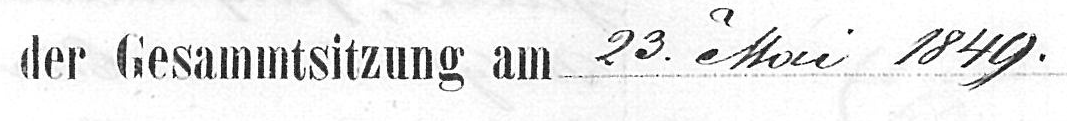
der Gesammtsitzung am 23. Mai 1849.
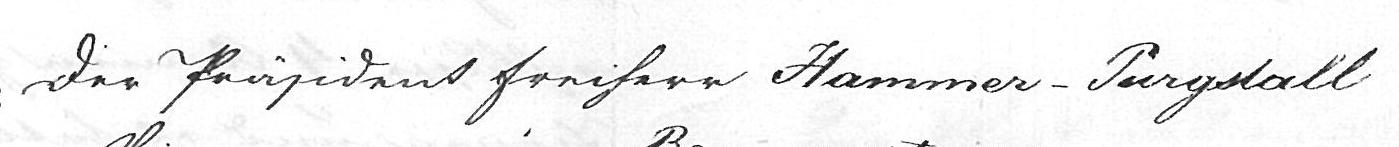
der Präsident Freiherr Hammer-Purgstall
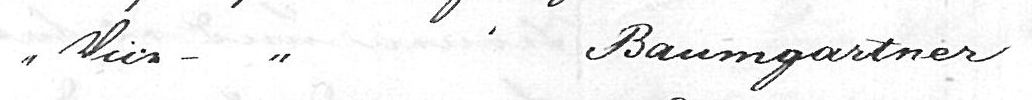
" Vice-" Baumgartner
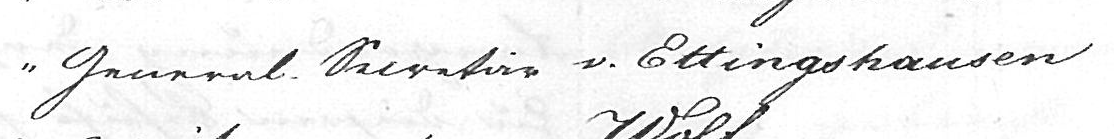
" General-Secretär v. Ettingshausen
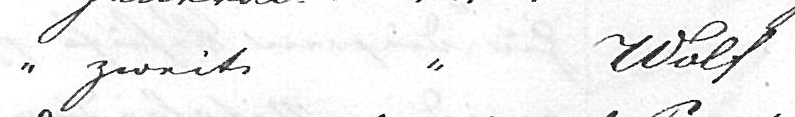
" zweite " Wolf
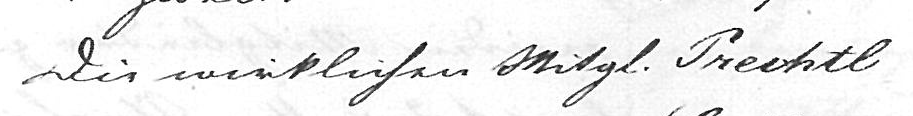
Die wirklichen Mitgl Prechtl
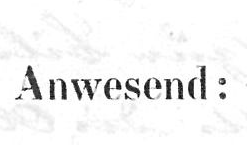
Anwesend:
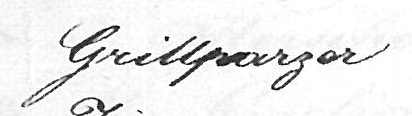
Grillparzer
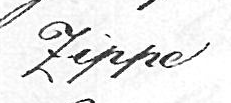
Zippe
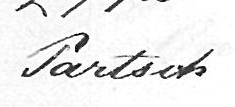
Partsch
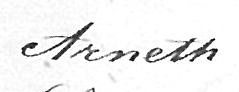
Arneth
